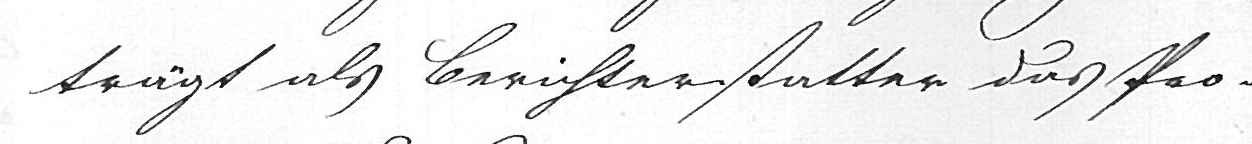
trägt als Berichterstatter das Pro-
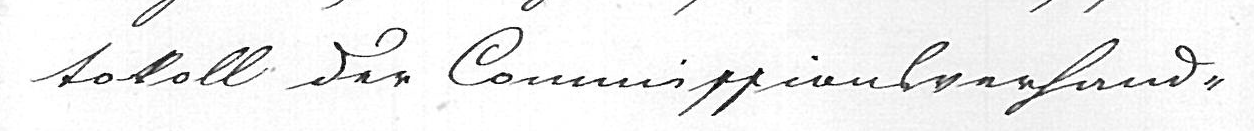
tokoll der Commissionsverhand-
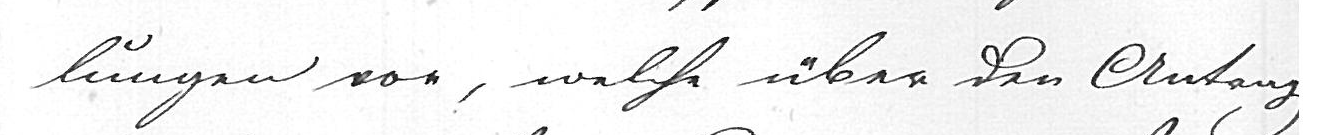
lungen vor, welche über den Antrag
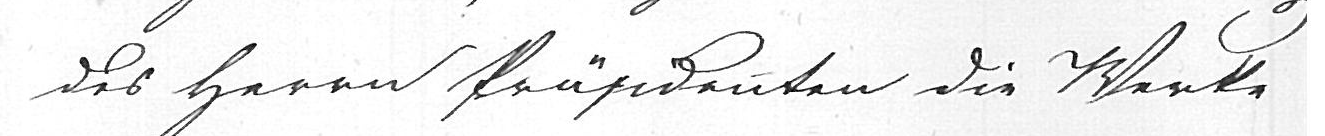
des Herrn Präsidenten die Werke
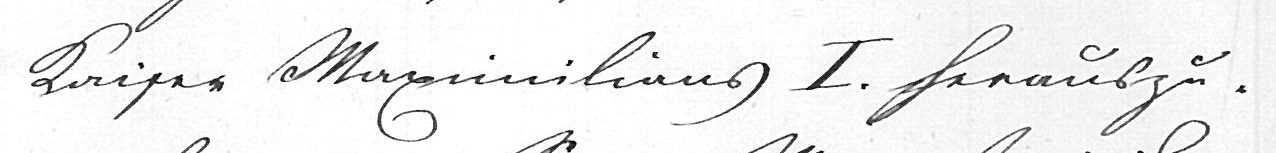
Kaiser Maximilians I. herauszu-
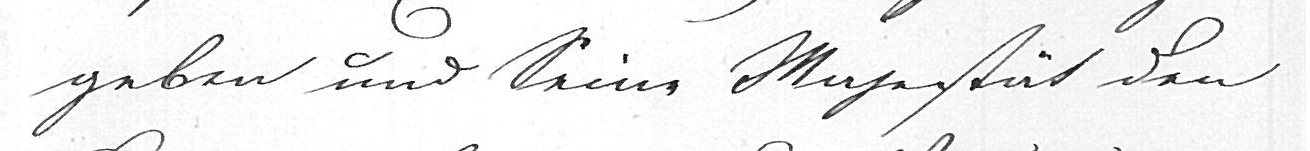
geben und Seine Majestät den
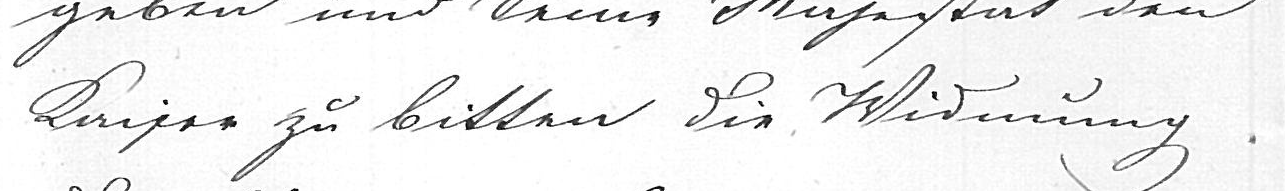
Kaiser zu bitten die Widmung
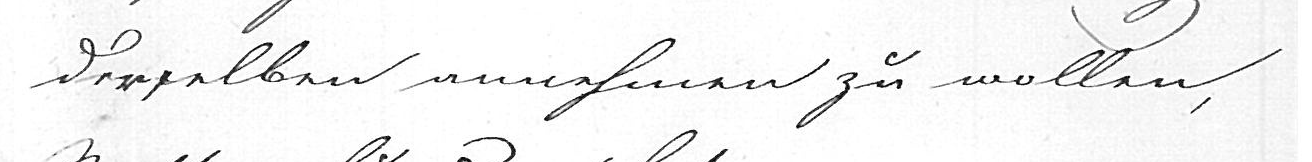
derselben annehmen zu wollen,
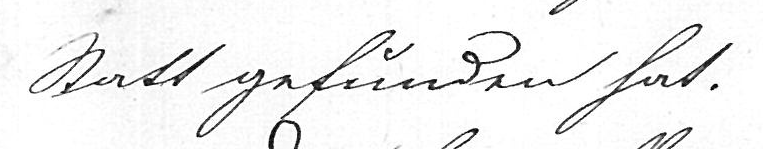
statt gefunden hat.
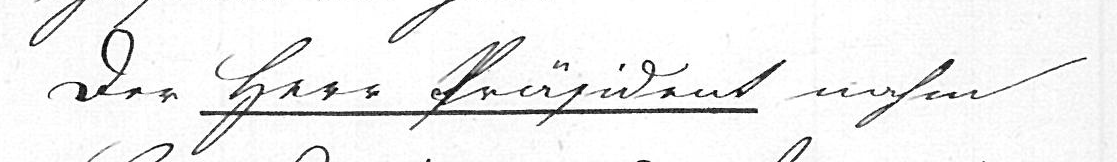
Der Herr Präsident nahm
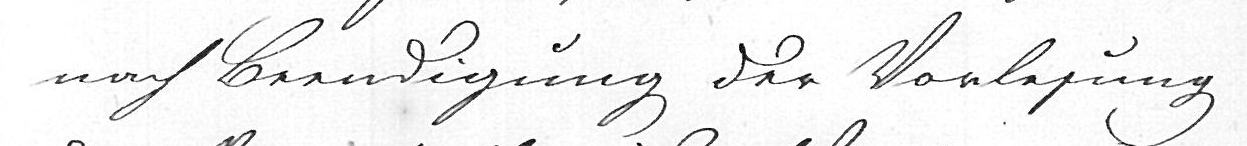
nach Beendigung der Vorlesung
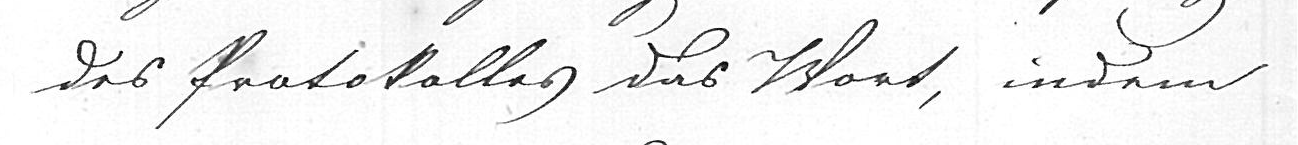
des Protokolles das Wort, indem
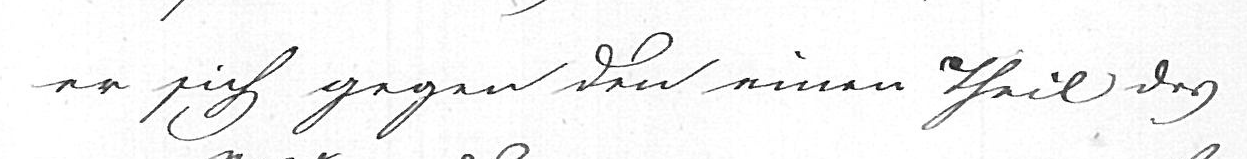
er sich gegen den einen Theil des
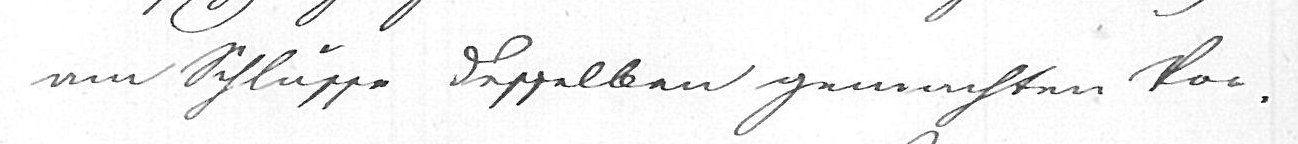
am Schlusse desselben gemachten Vor-
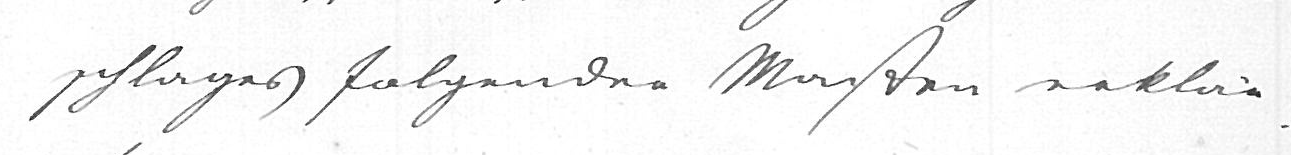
schlages folgender Maßen erklär-
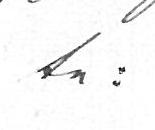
te.
